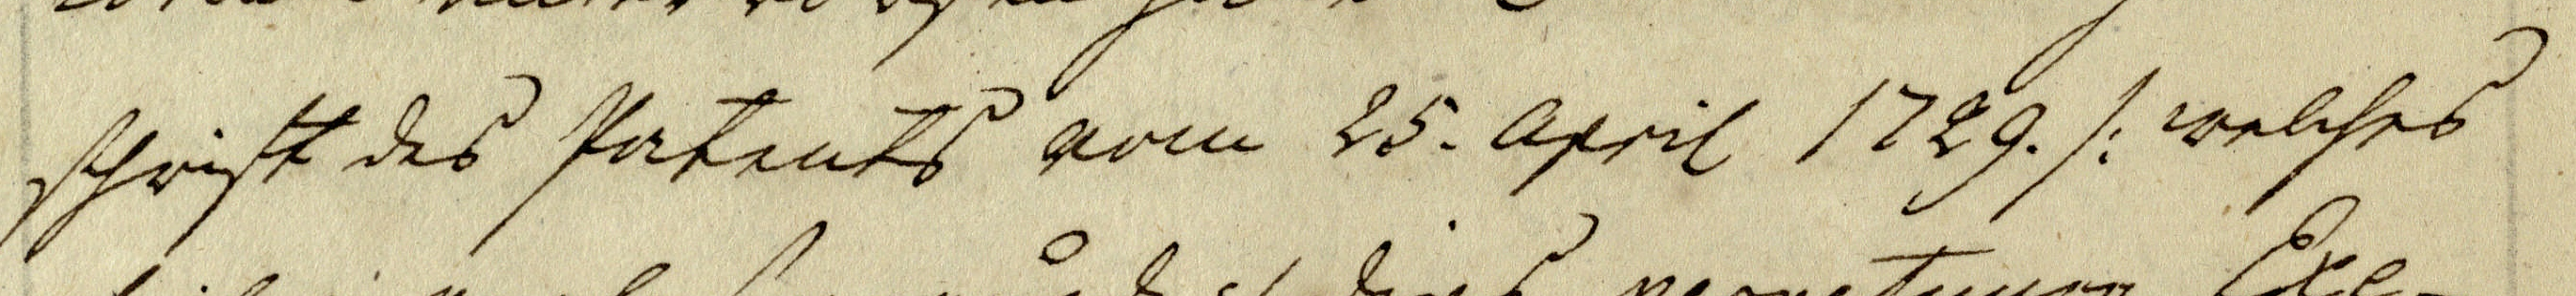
schrift des Patents vom 25. April 1729. /: welches
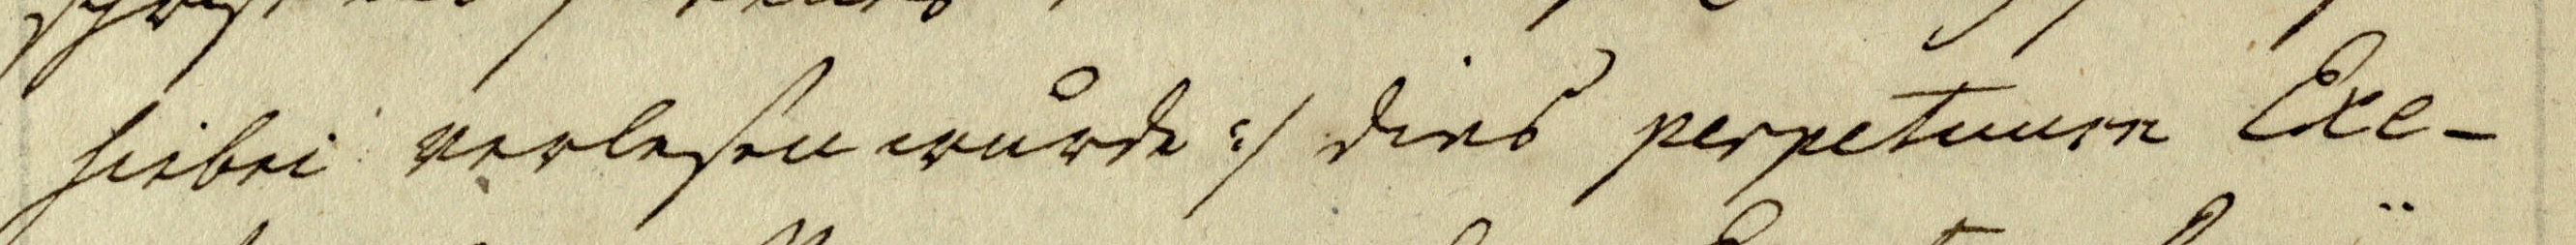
hiebei verlesen wurde :/ dies perpetuum Exe¬
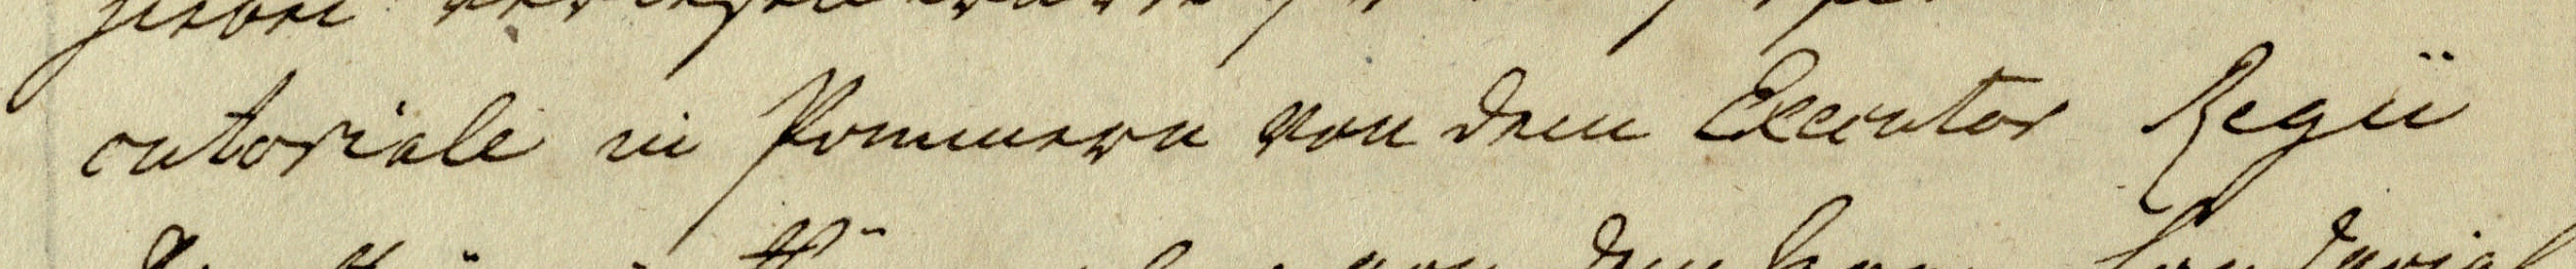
cutoriale in Pommern von dem Executor Regii
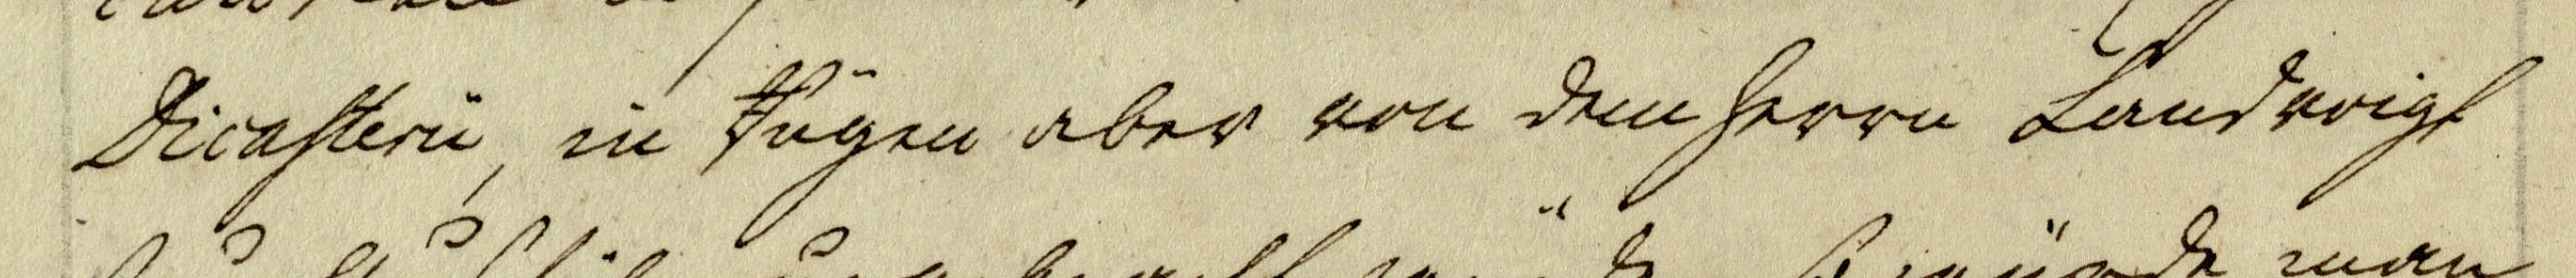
Dicasterii, in Rügen aber von dem Herrn Land Voigt
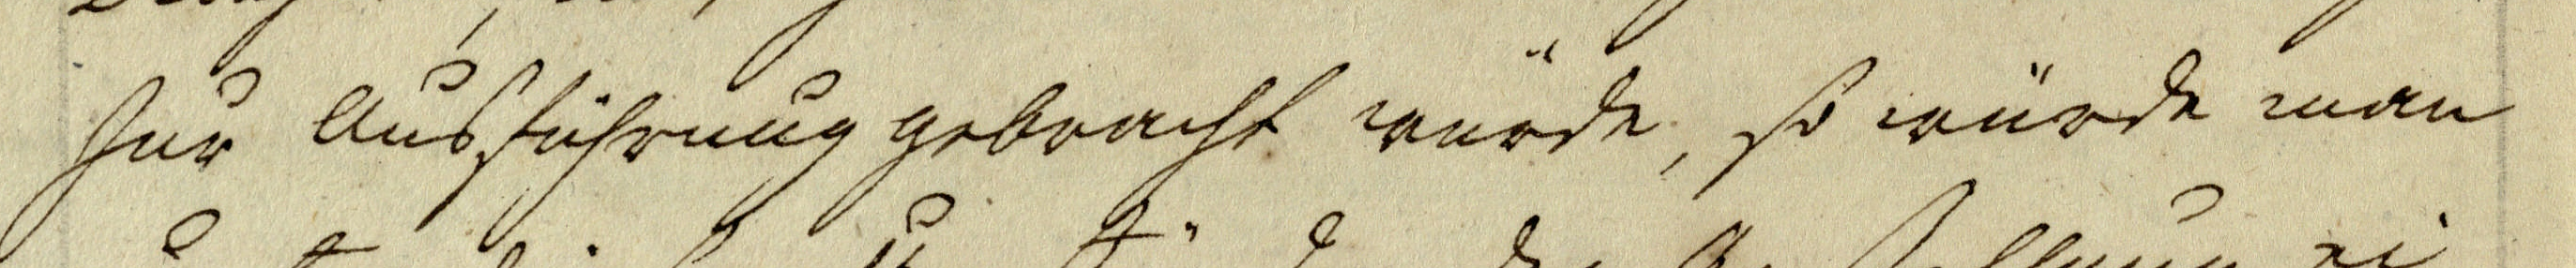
zur Ausführung gebracht würde, so würde man
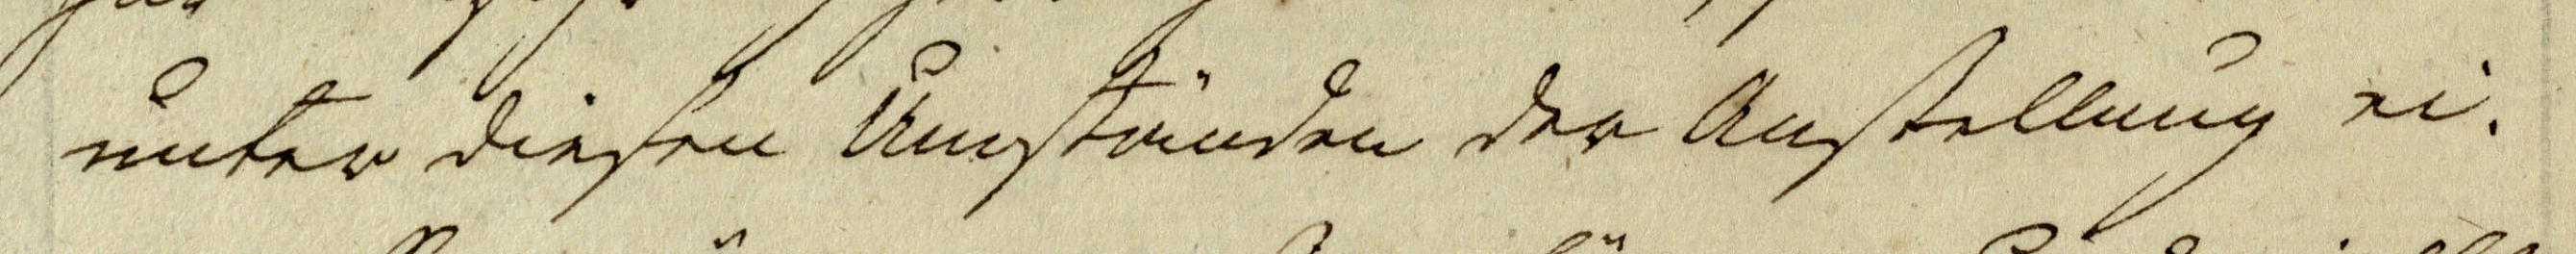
unter diesen Umständen der Anstellung ei¬
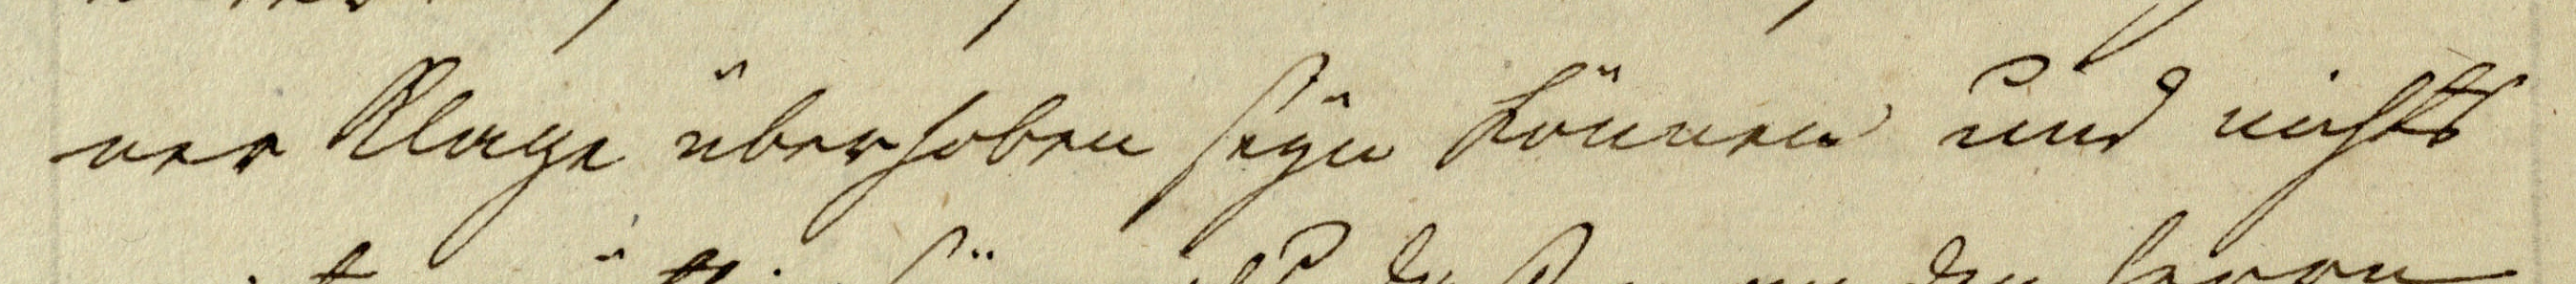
ner Klage überhoben seÿn können und nichts
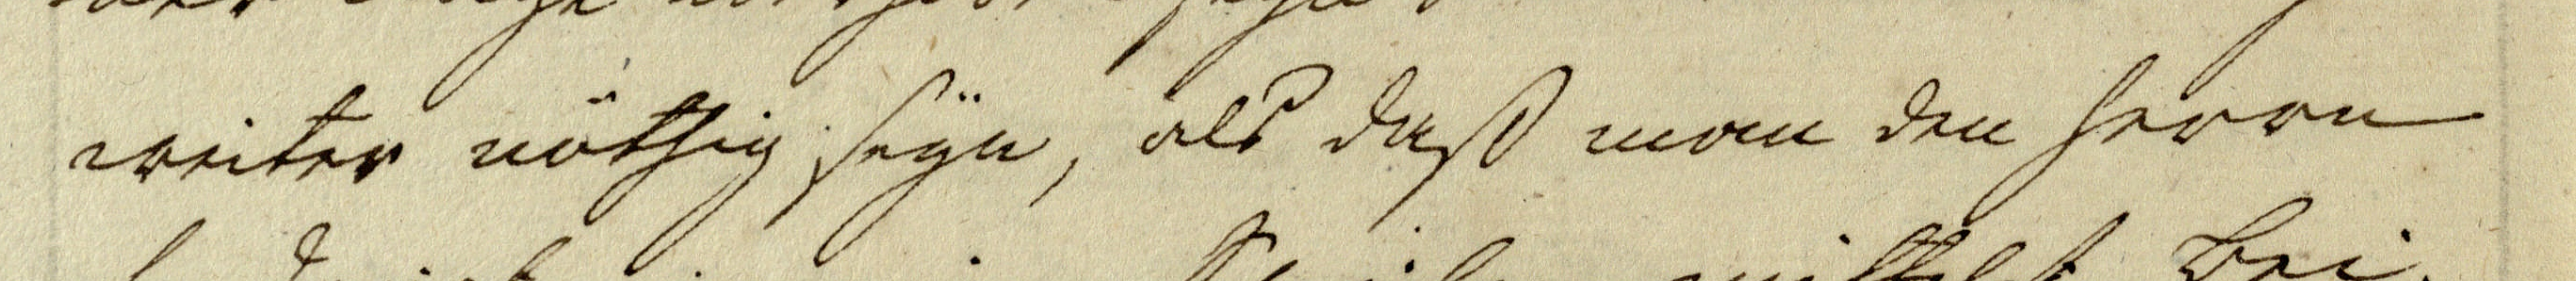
weiter nöthig seÿn, als daß man den Herrn
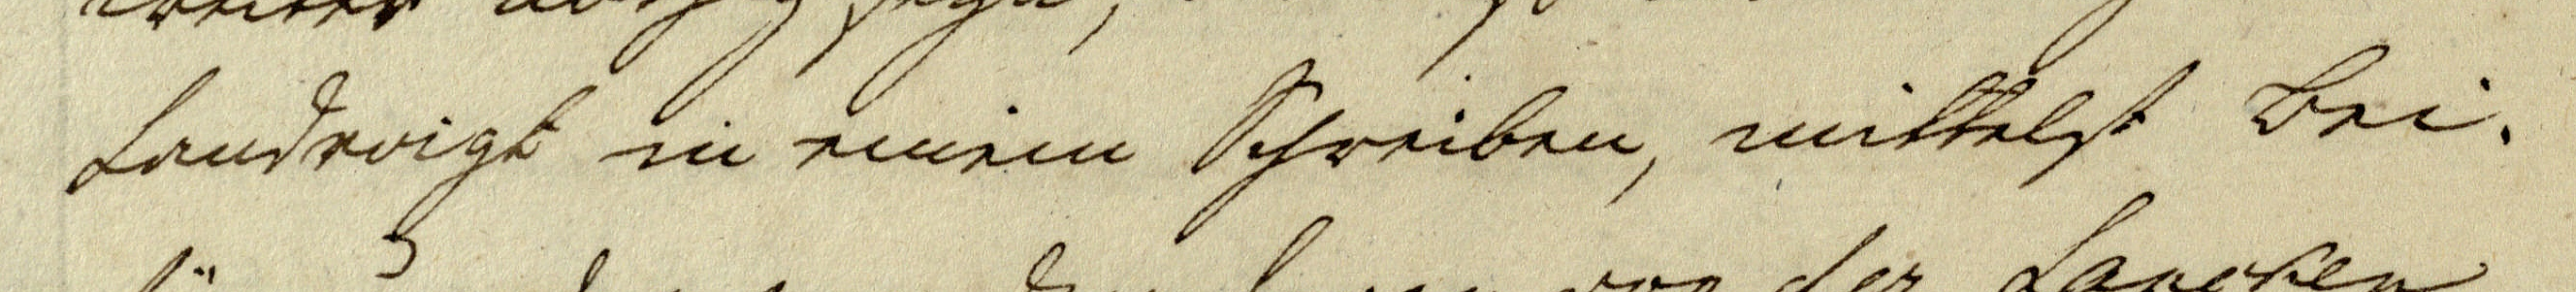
Landvoigtt in einem Schreiben, mittelst Bei¬
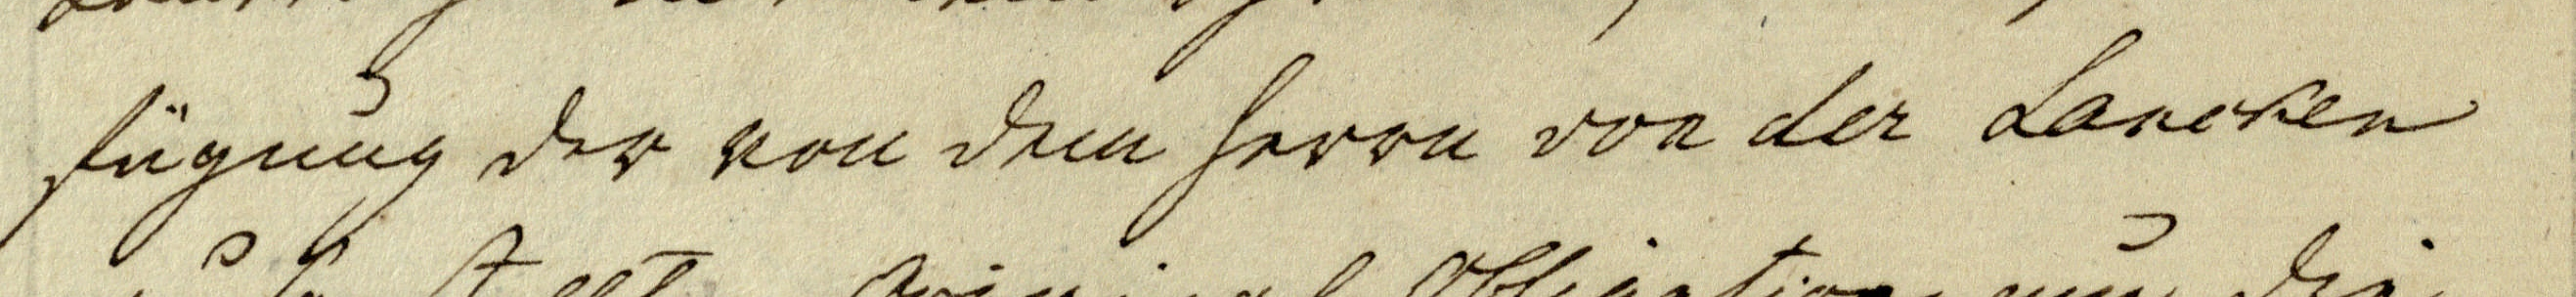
fügung der von dem Herrn von der Lancken
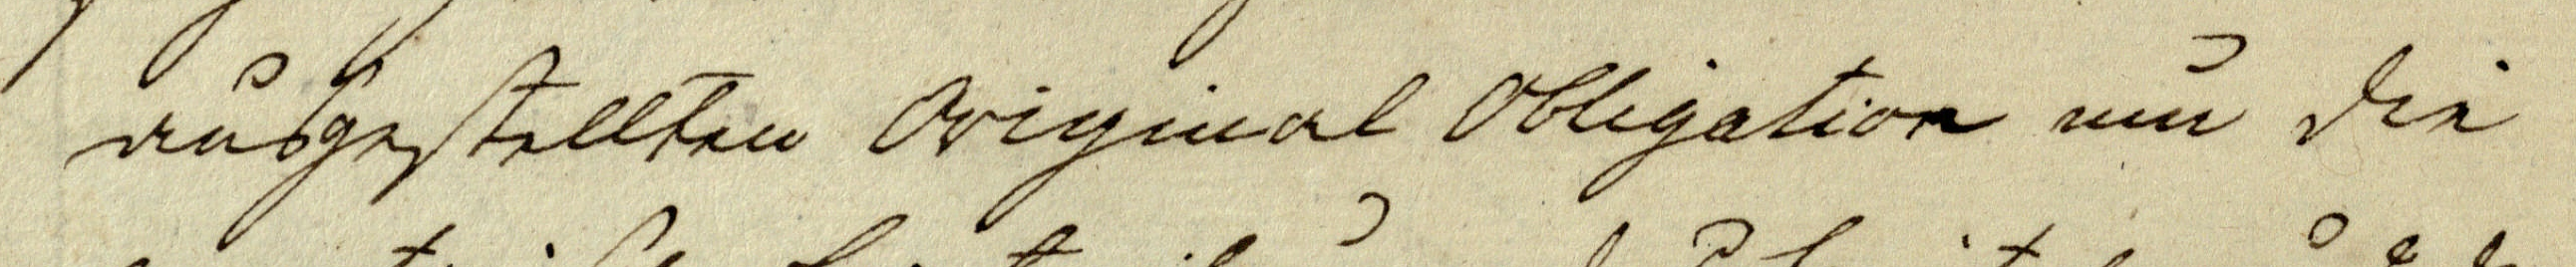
ausgestellten Original Obligation um die
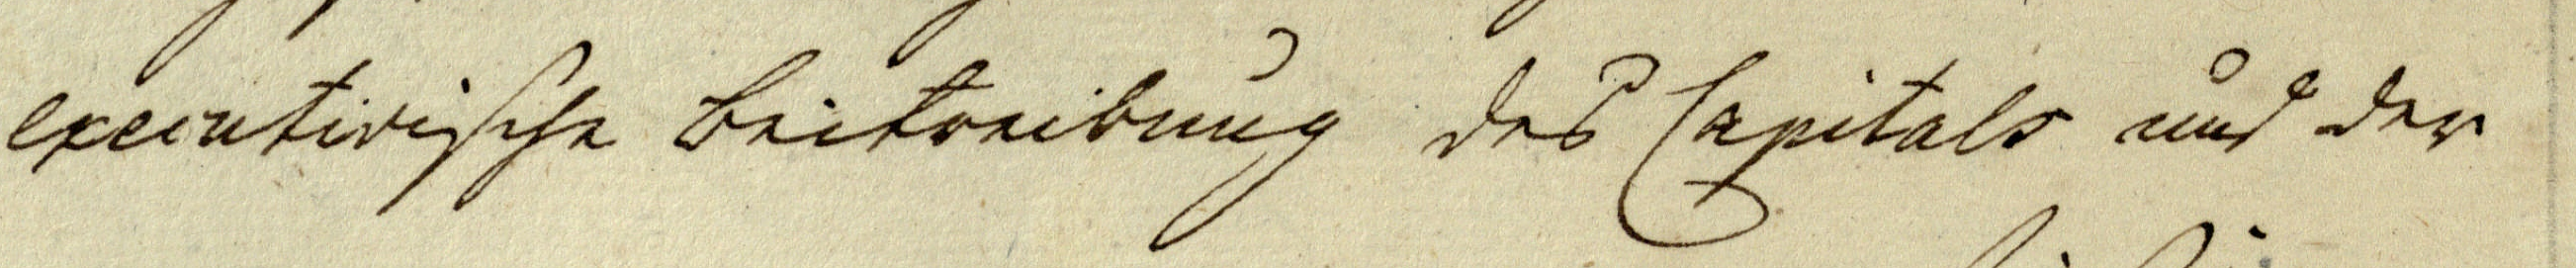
executivische Beitreibung des Capitals und der
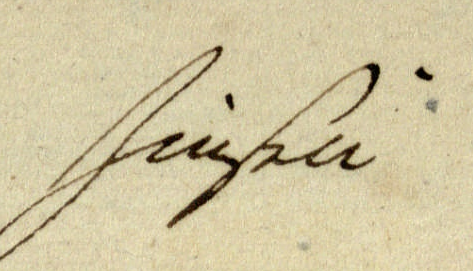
Zinsen
